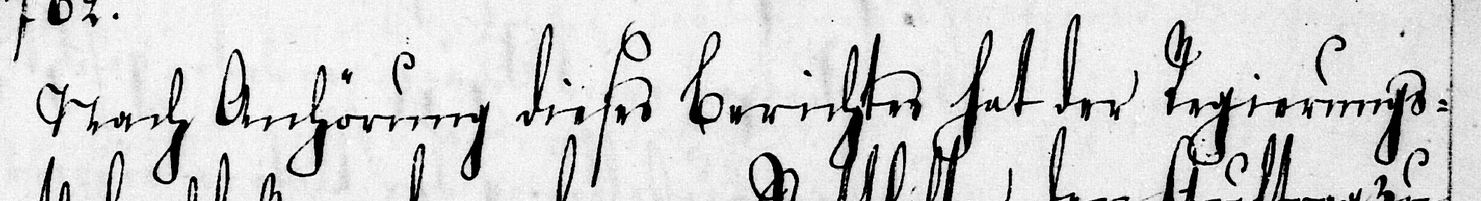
Nach Anhörung dieses Berichtes hat der Regierungs¬
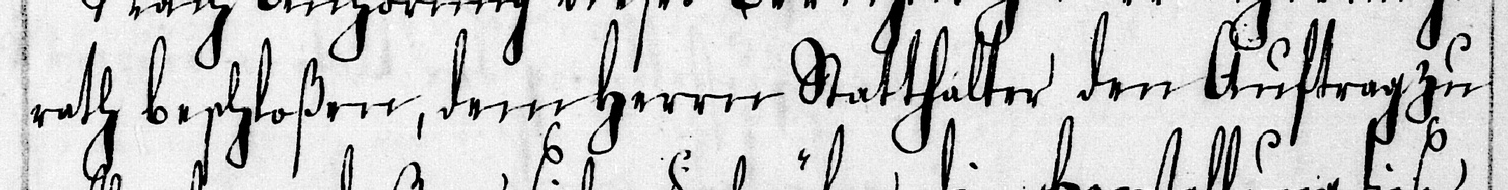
rath beschloßen, dem Herrn Statthalter den Auftrag zu
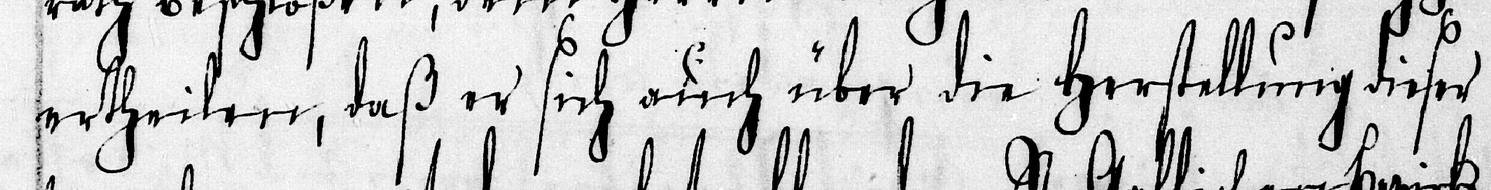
ertheilen, daß er sich auch über die Herstellung dieser
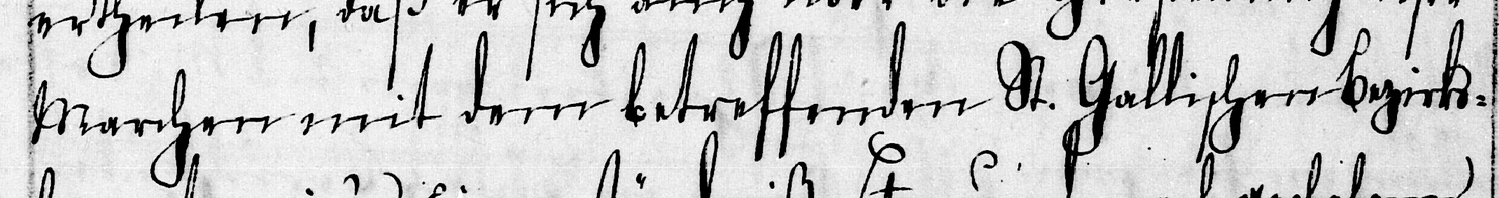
Marchen mit dem betreffenden St. Gallischen Bezirk¬
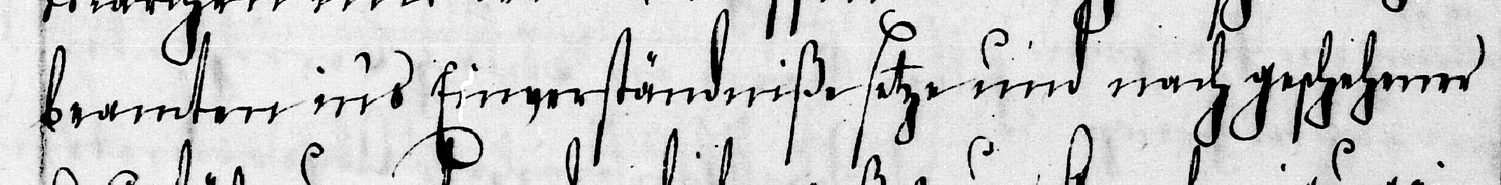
sbeamten in’s Einverständniße setze und nach geschehener
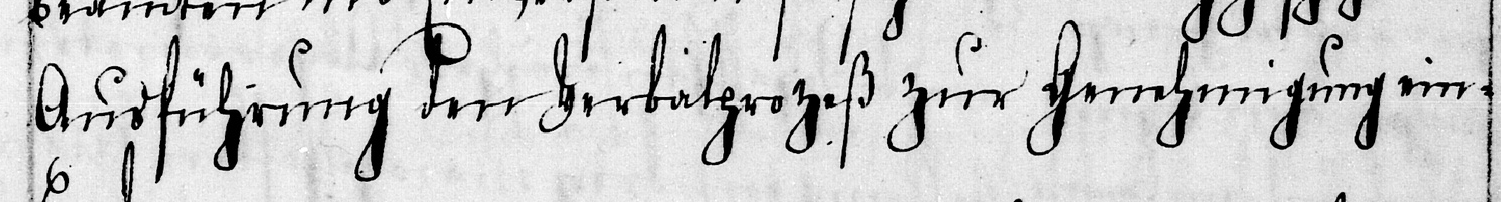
Ausführung den Verpalprozeß zur Genehmigung ein¬
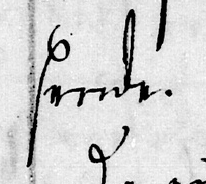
sende.
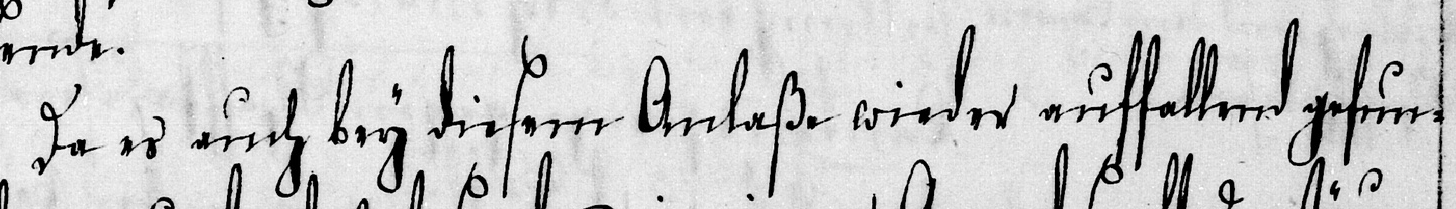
Da es auch bey diesem Anlaße wieder auffallend gefu¬
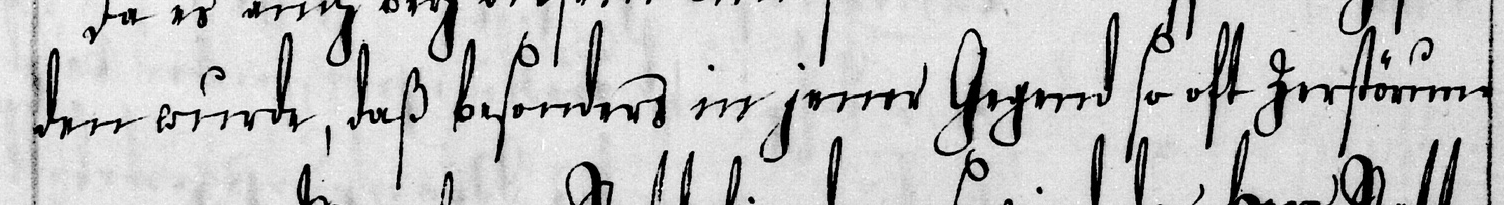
nden wurde, daß besonders in jener Gegend so oft Zerstöru¬
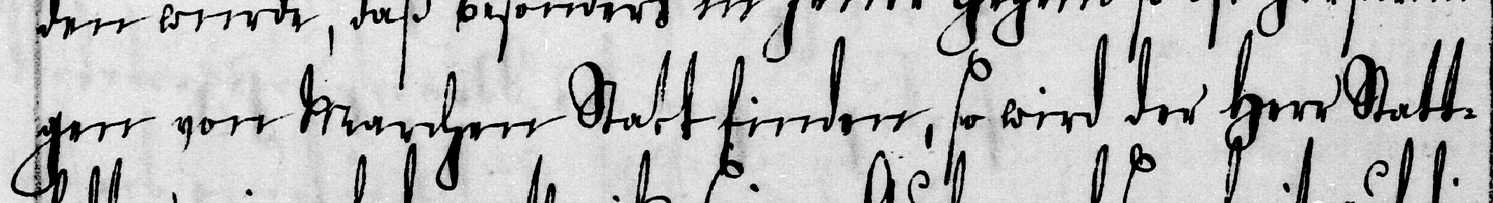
ngen von Marchen Statt finden, so wird der Herr Statt¬
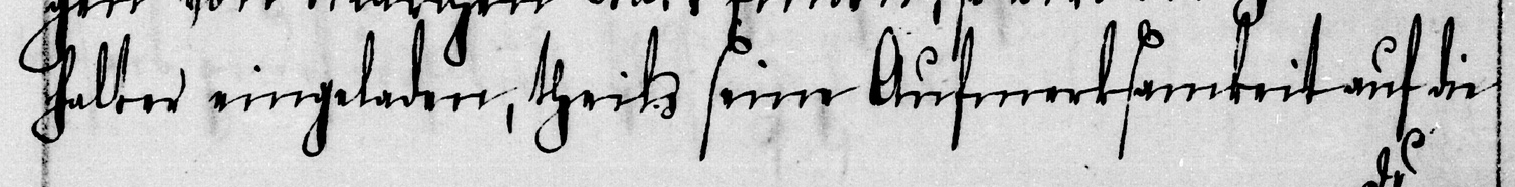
halter eingeladen, theils seine Aufmerksamkeit auf die
